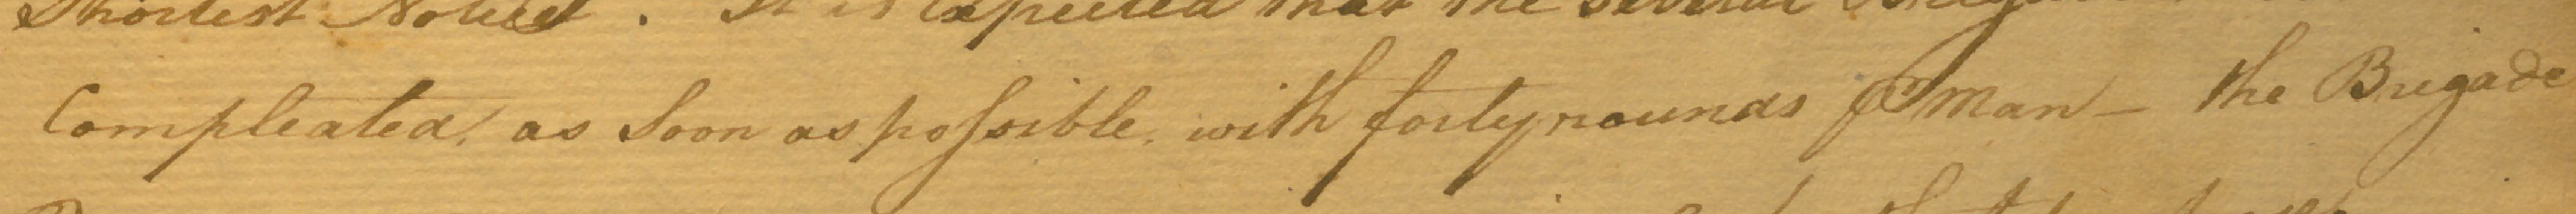Compleated as soon as possible with forty rounds per man- the Brigade
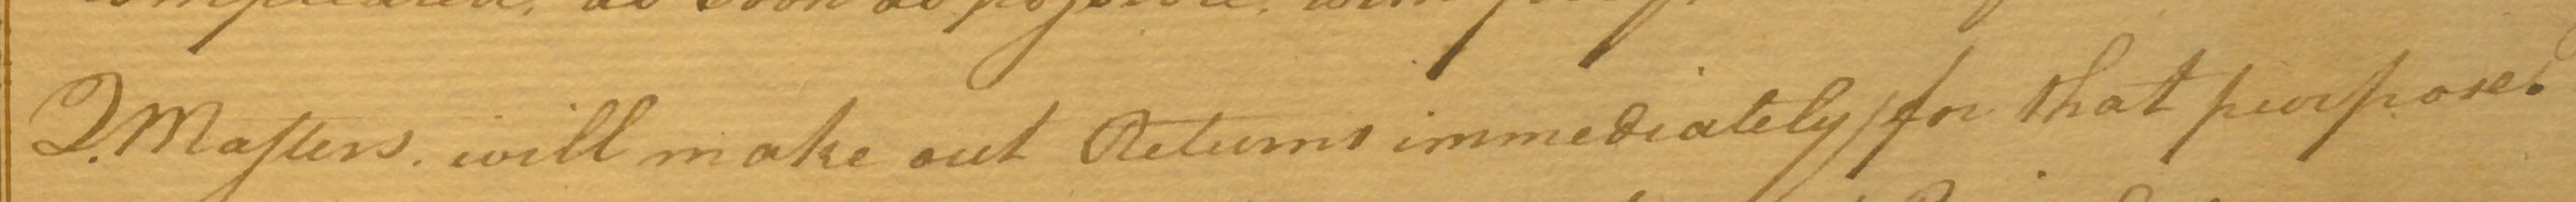Q. Masters will make out Returns immediately for that purpose.
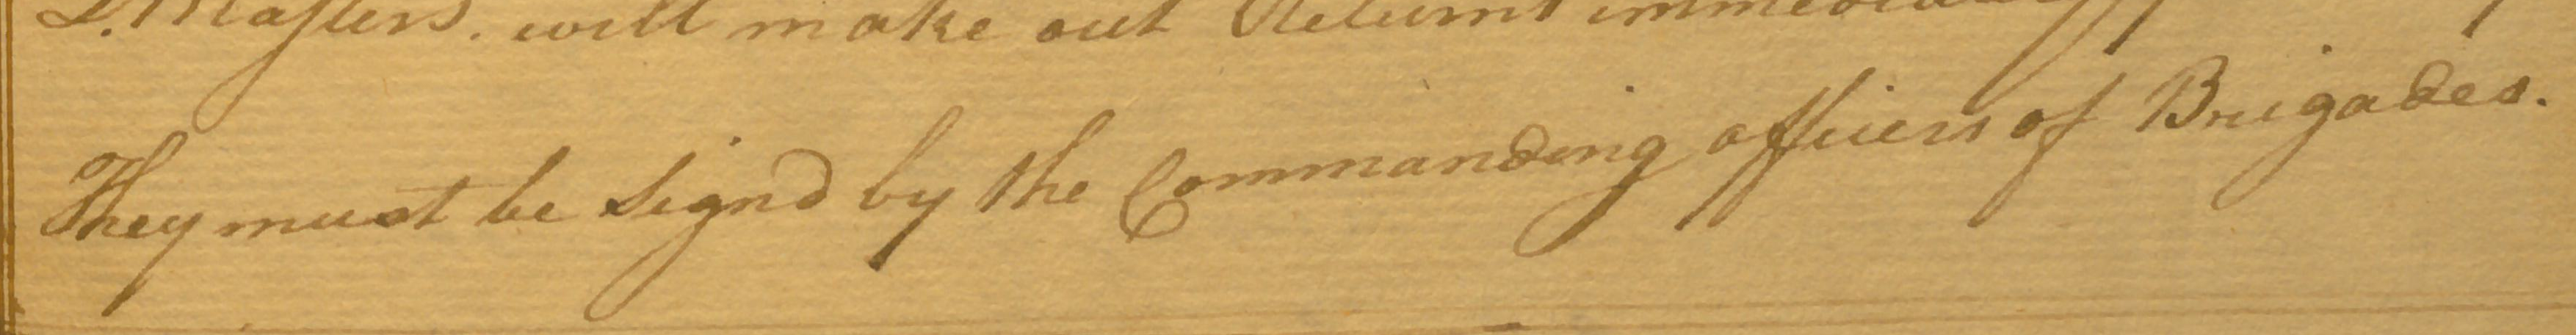They must be signd by the Commanding officers of Brigades.
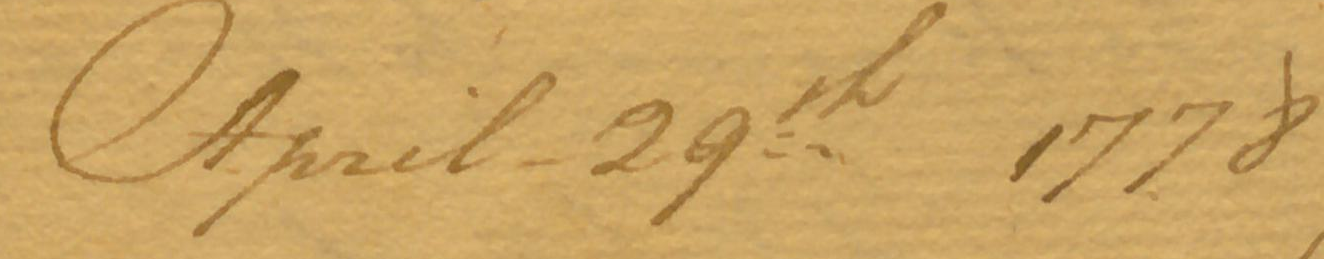April 29^th. 1778
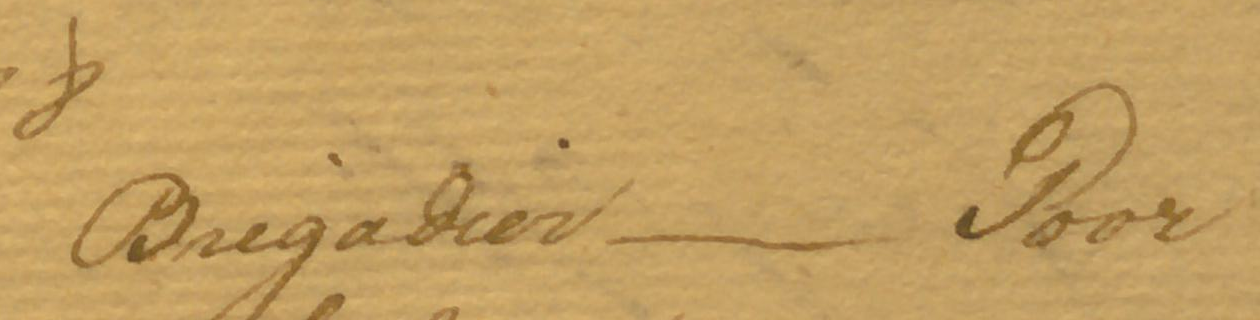Brigadier- Poor
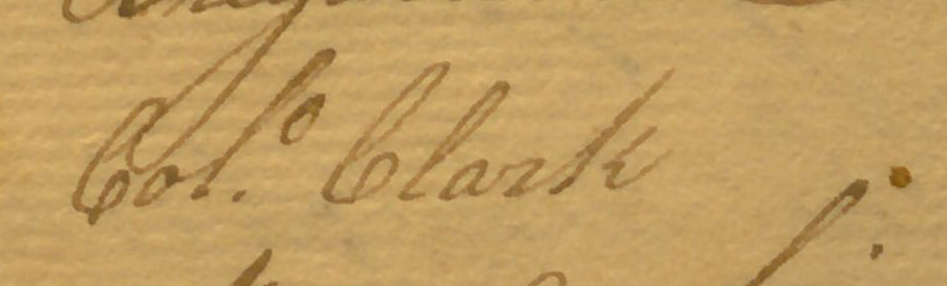Col^o. Clark
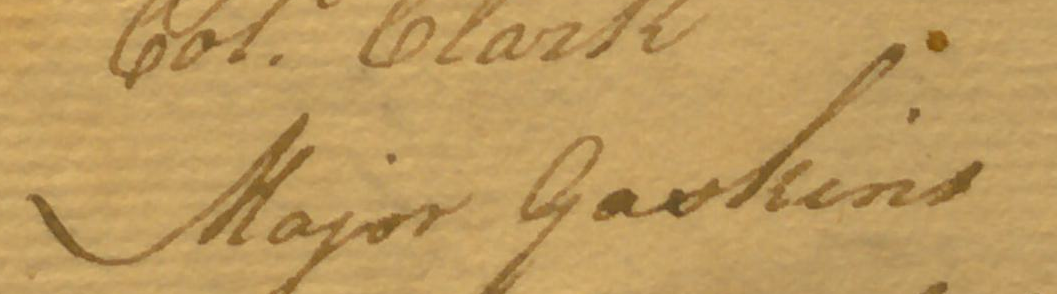Major Gaskins
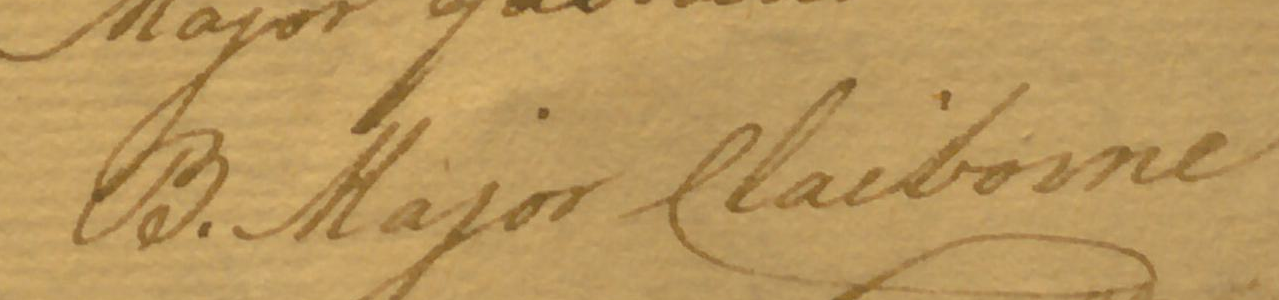B. Major Claiborne
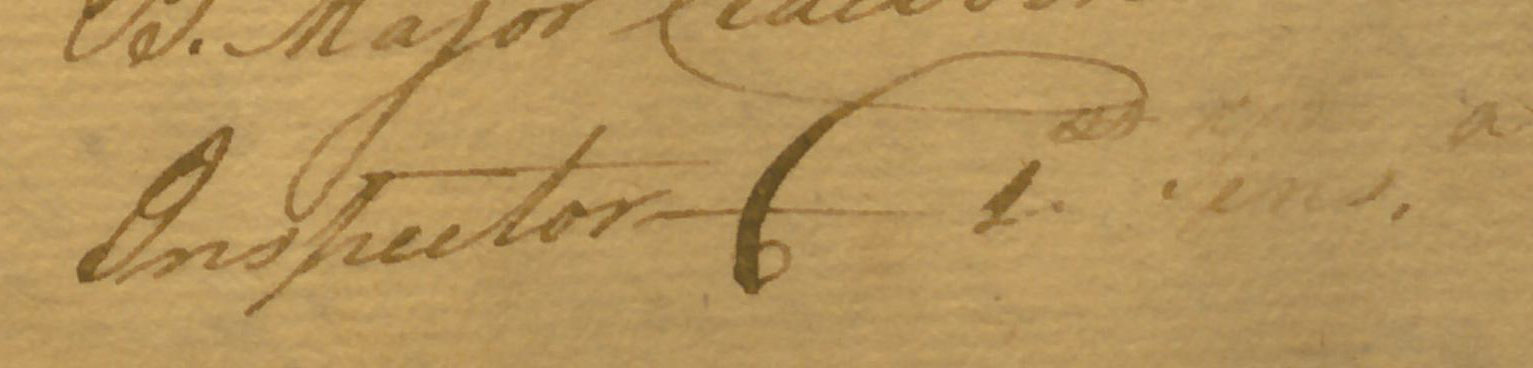Inspector- 1^st. Pensa.
